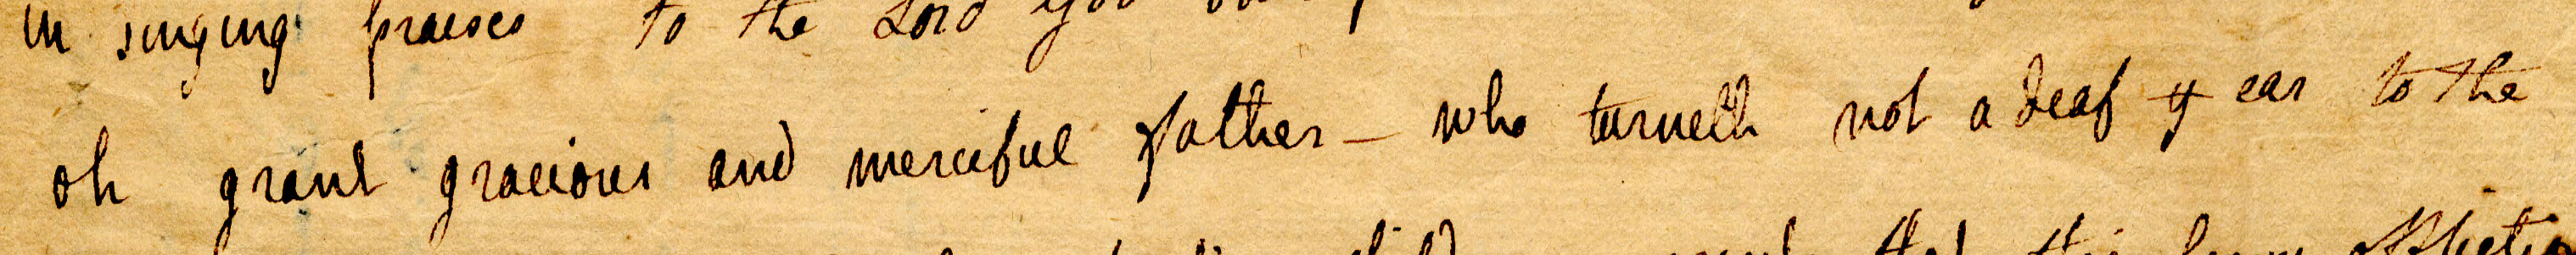oh grant gracious and merciful father- who turneth not a deaf ear to the
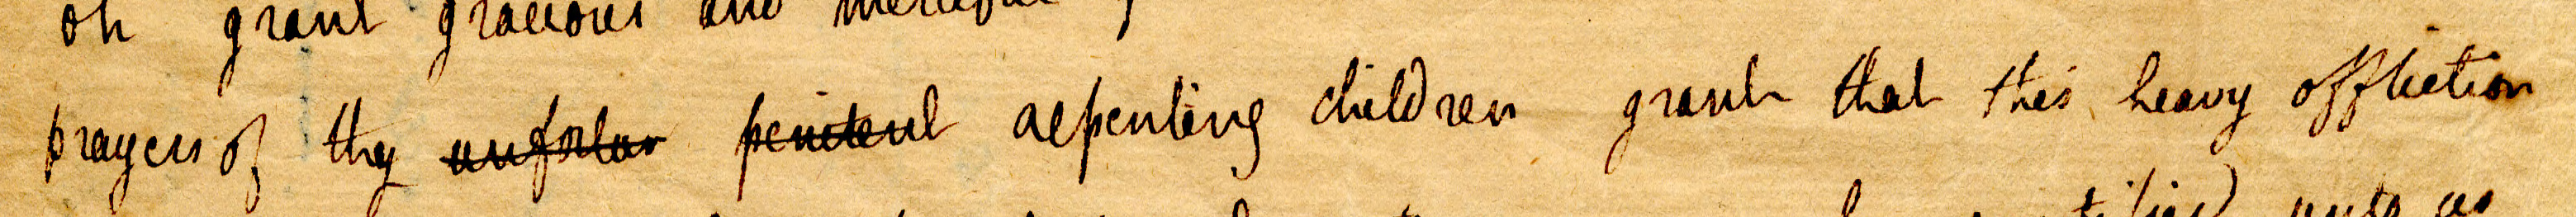prayer of thy [_______] [penitent] repenting children grant that this heavy affliction
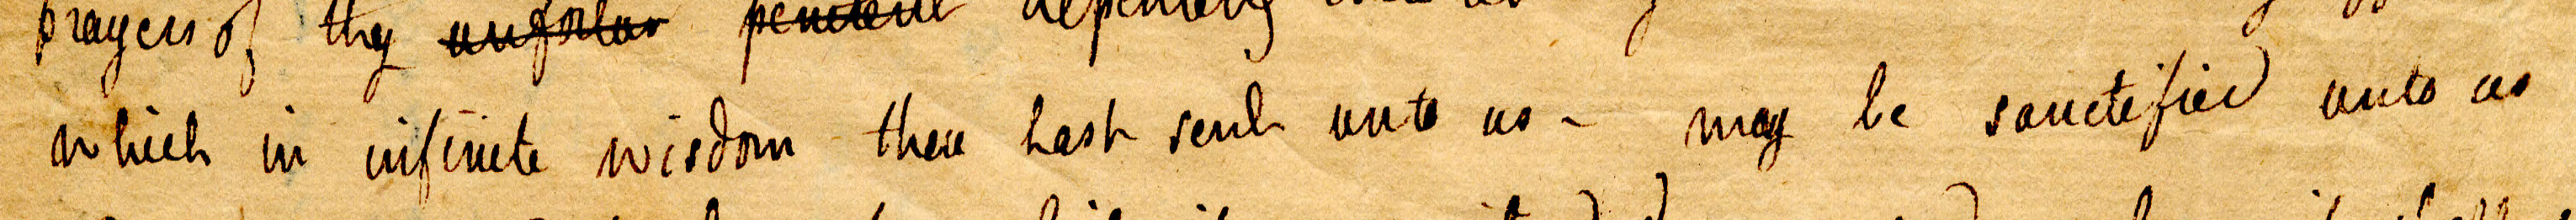which in infinite wisdom these last sent unto us- may be sanctified unto us
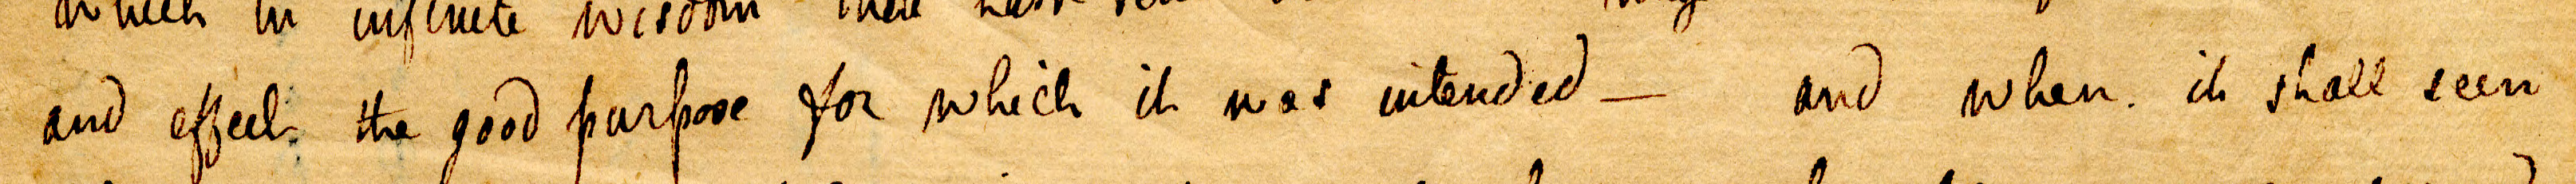and effect the good purpose for which it was intended- and when it shall seem
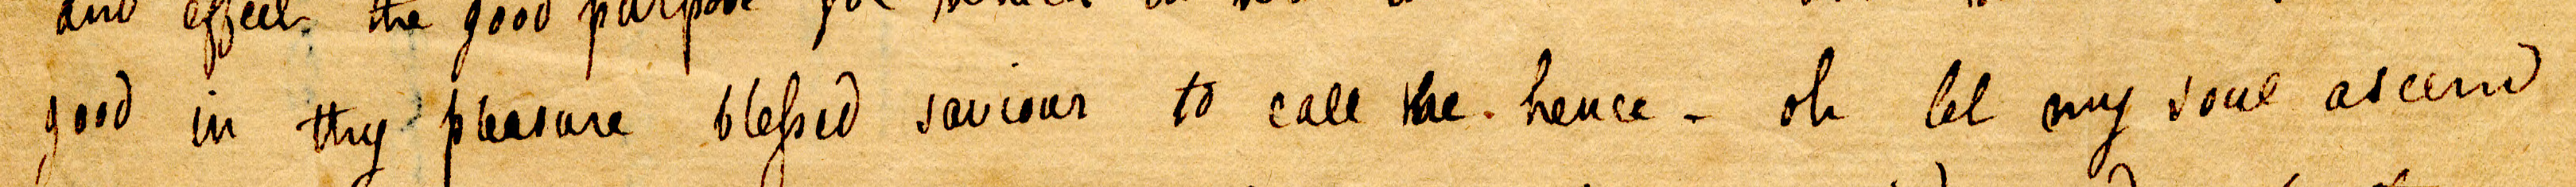good in thy pleasure blessed saviour to call me hence- oh let my soul ascend
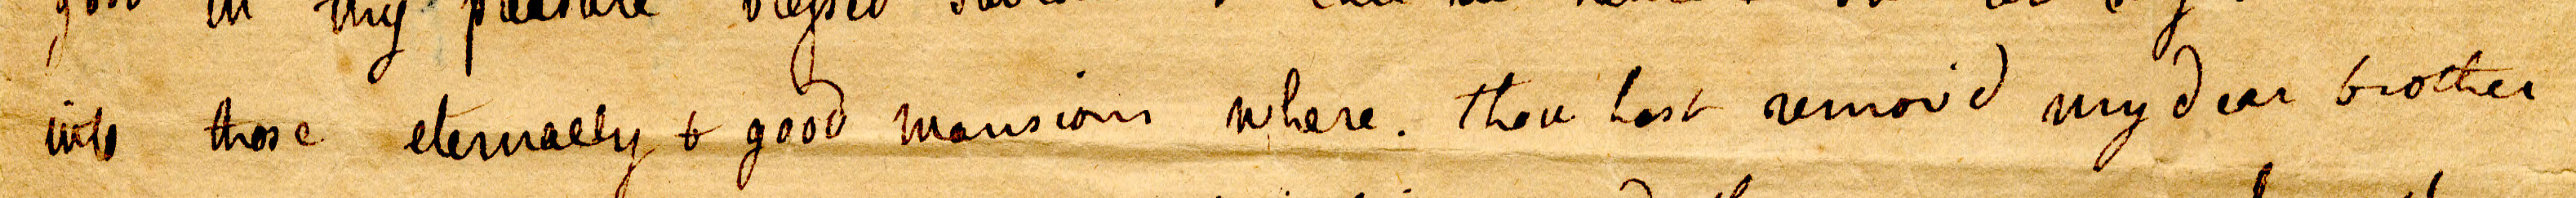into those eternally & good mansions where thou last remov'd my dear brother
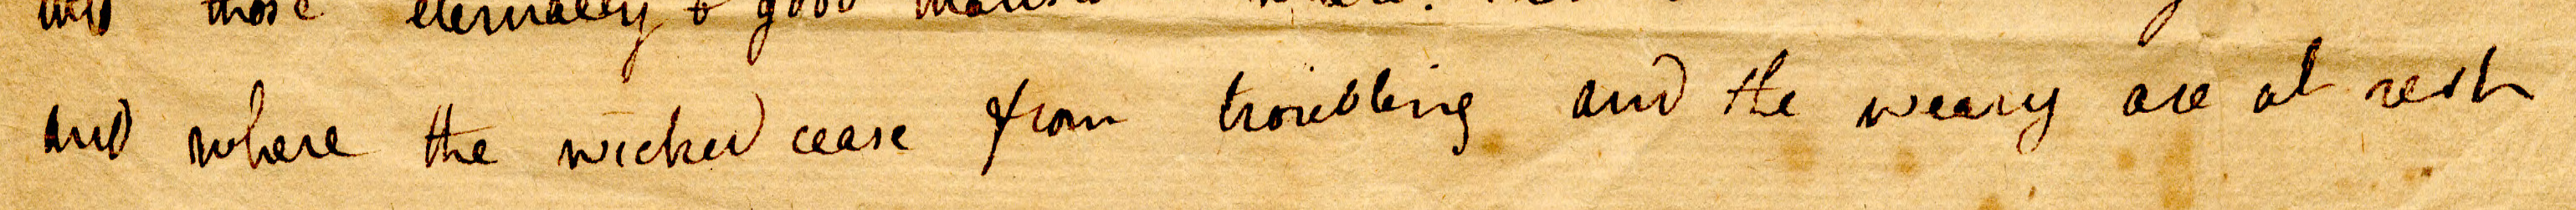and where the wicked cease from troubling and the weary are at rest
